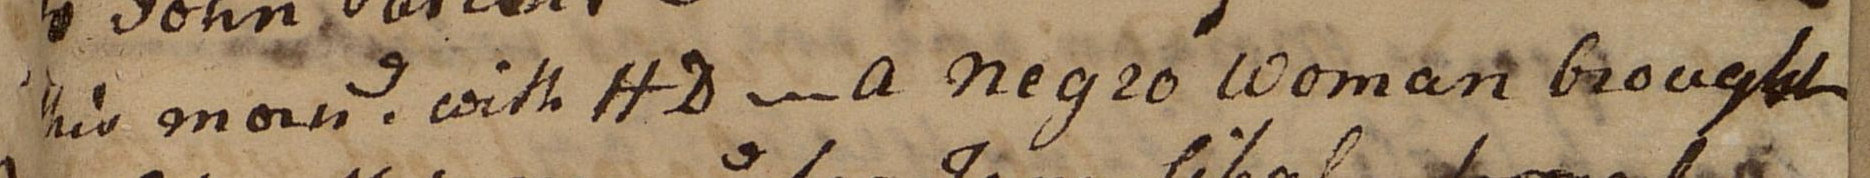this morn.^g with HD- A negro woman brought
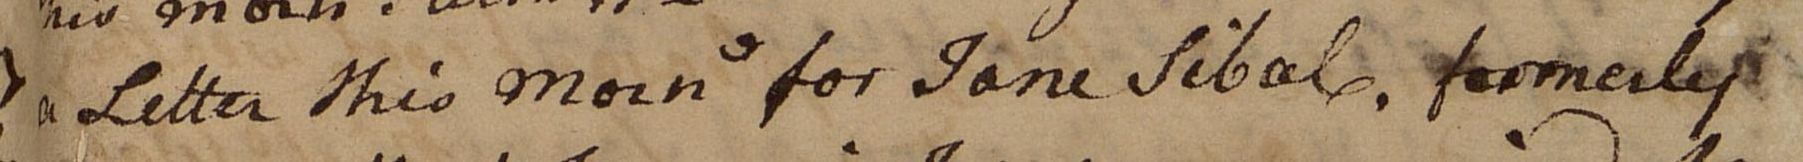Letter this morn^g for Jane Sibal, formerly
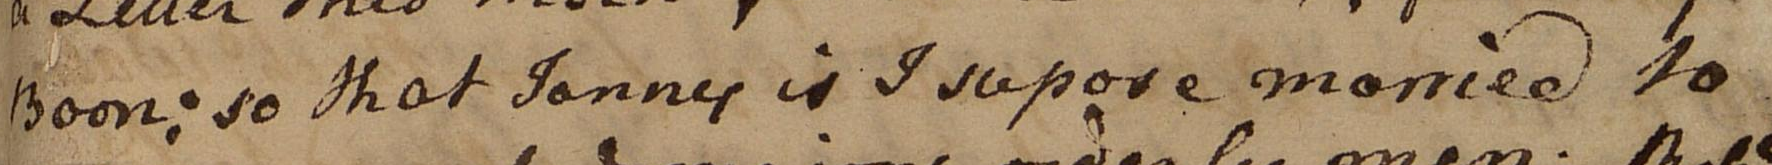Boon: so that Janny is I supose married to
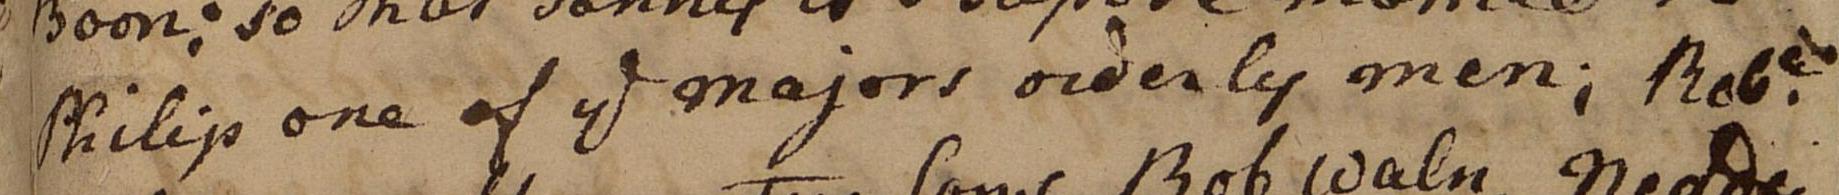Philip one of y^e majors orderly men; Rob^e
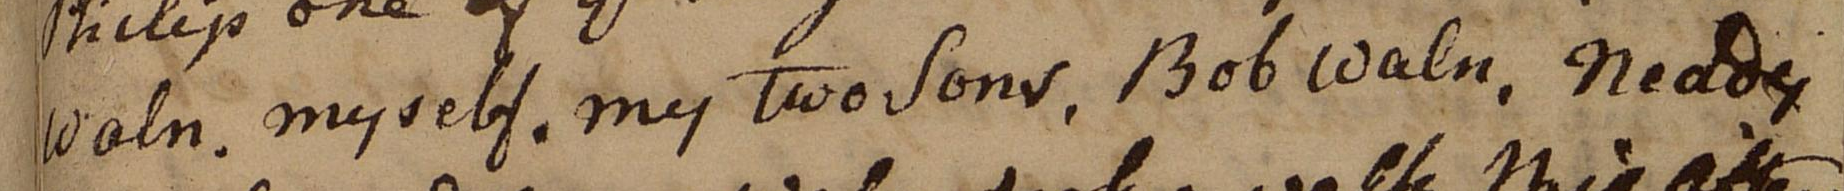Waln. myself, my two Sons, Bob Waln, Neddy
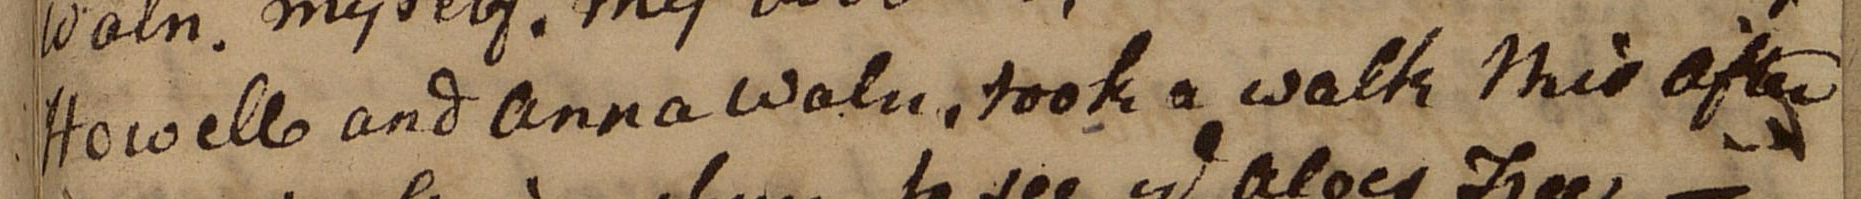Howell and Anna Waln, took a walk this after
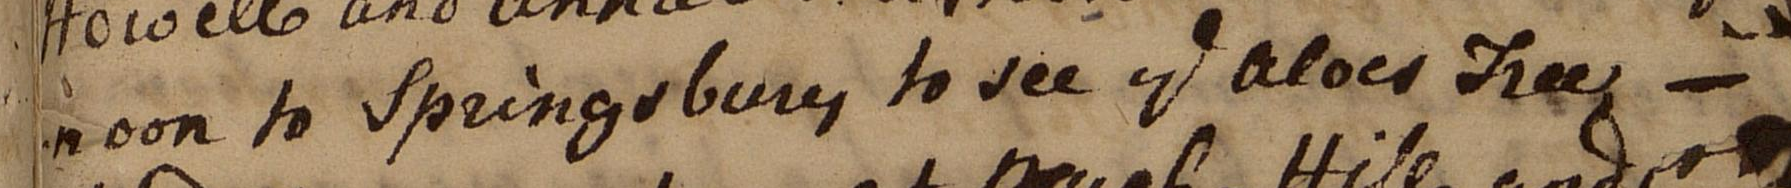noon to Springsbury to see y^e Aloes Tree-
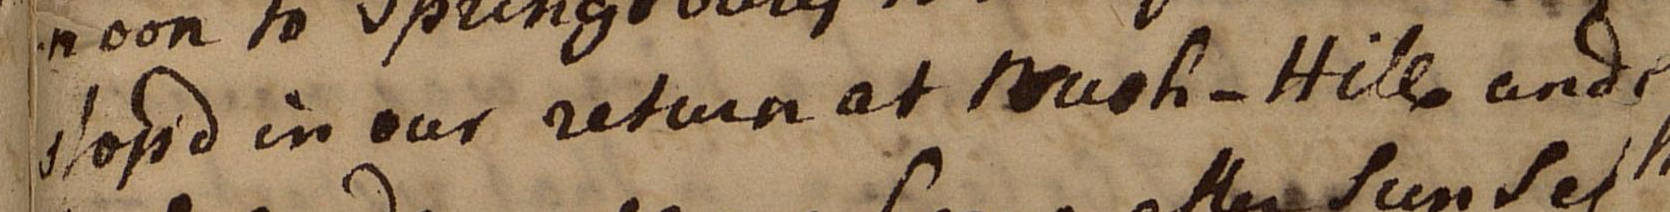stopd in our return at Bush- Hill and
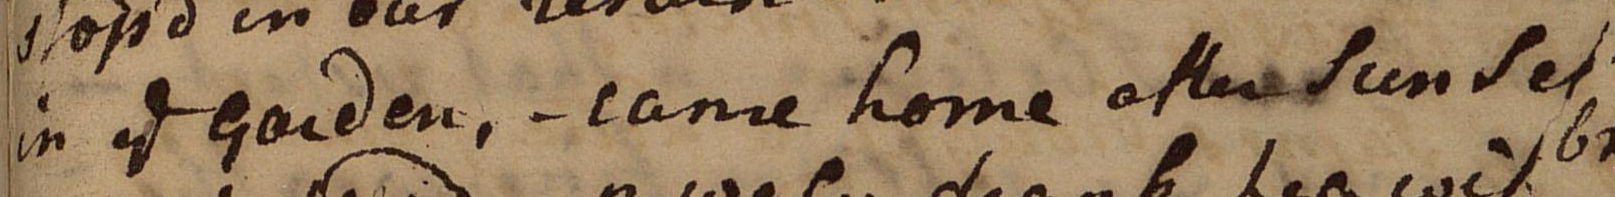in y^e Garden,- came home after Sun Set
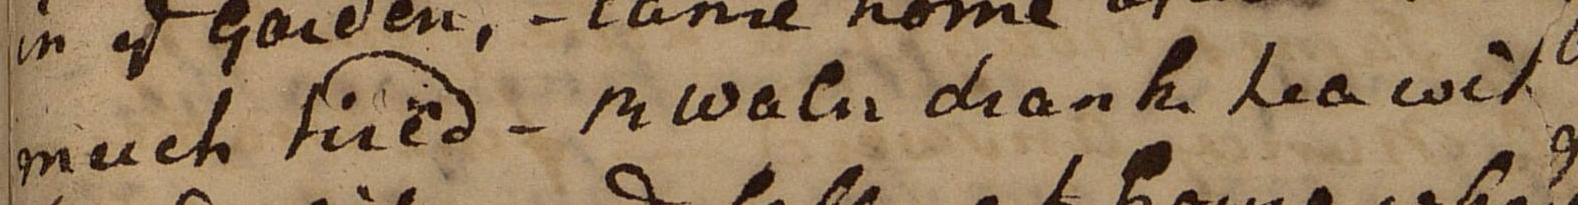much tried- R Waln drank tea wit
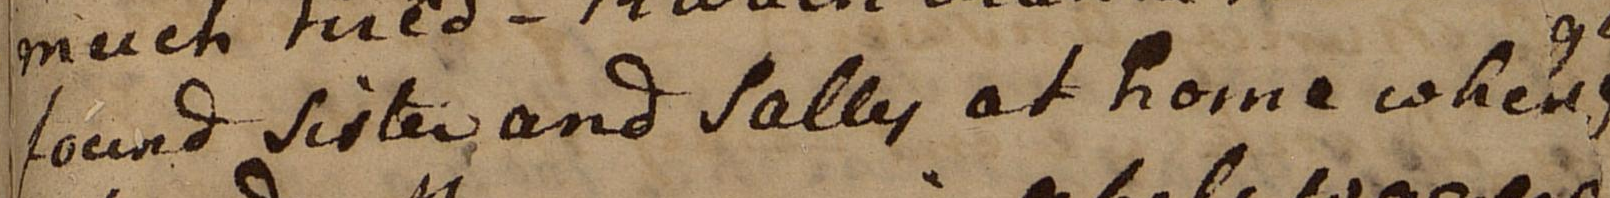found Sister and Sally at home when
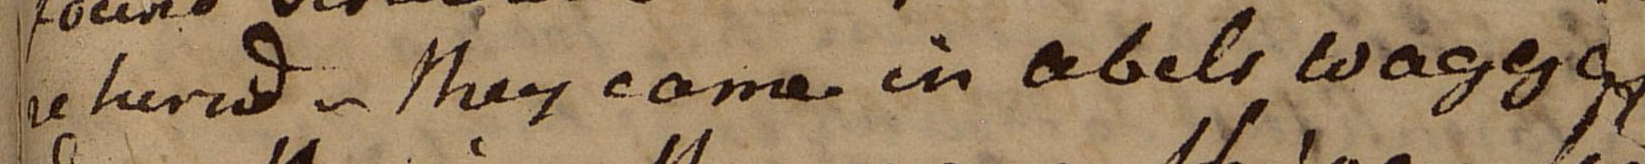re hevied- they came in Abels waggo
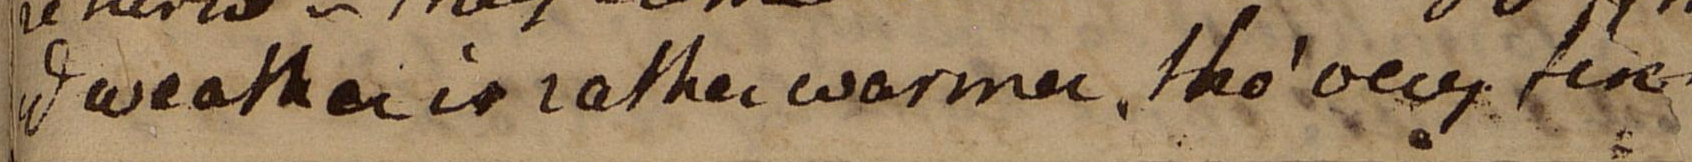y^e weather is rather warmer, tho' very fine
